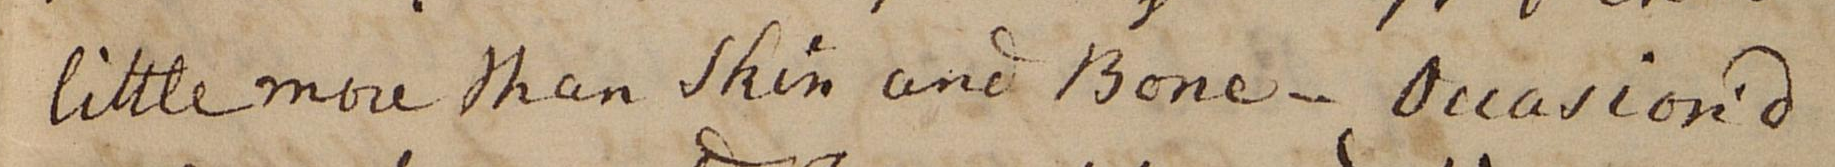little more than Skin and Bone- Occasion'd
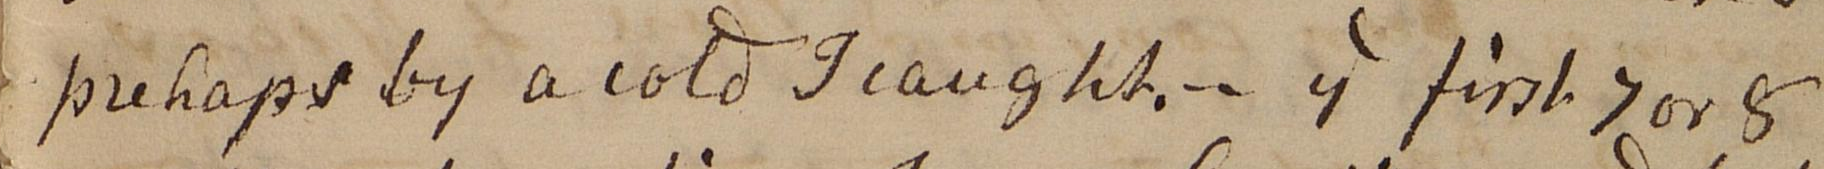prehaps by a cold I caught.- y^e first 7or 8
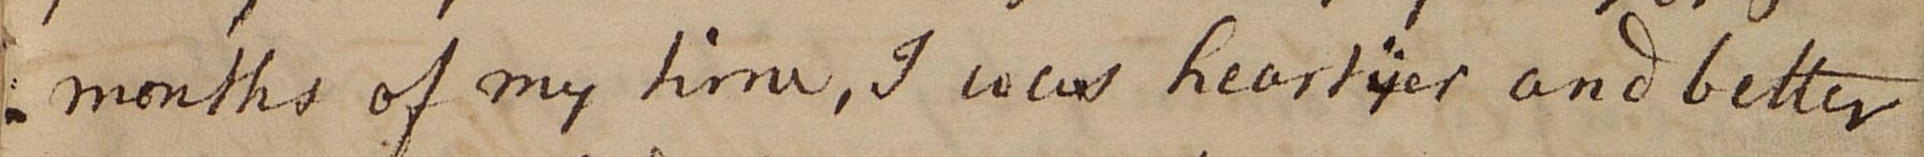months of my time, I was heartyer and better
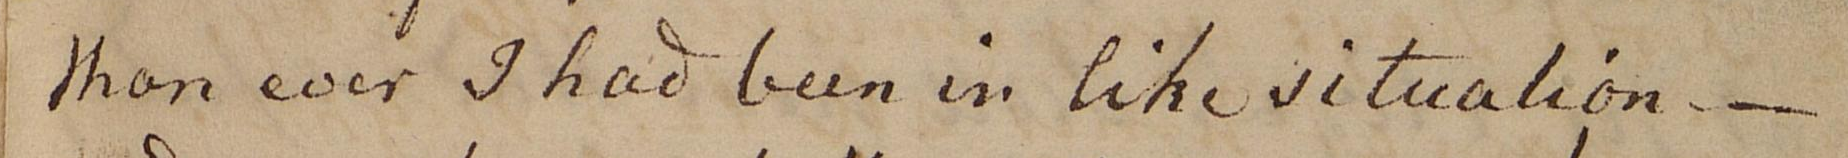than ever I had been in like situation--
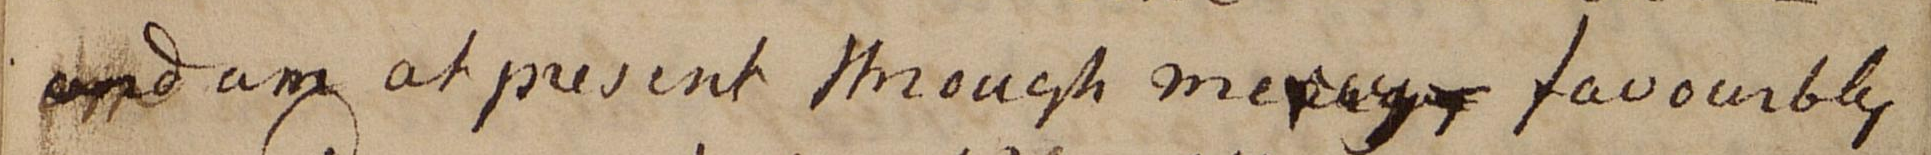and am at present through me [____] favourbly
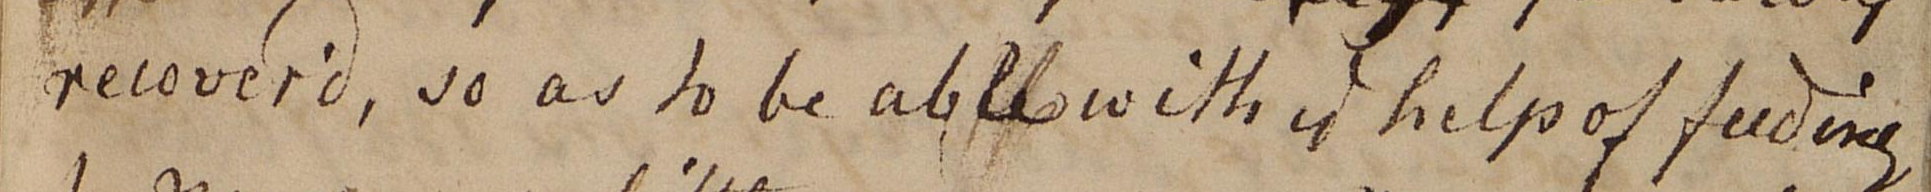recover'd, so as to be able with y^e help of feeding
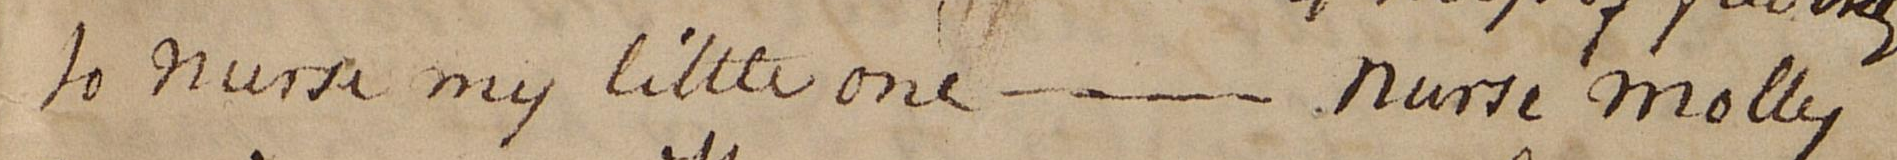to nurse my little one- Nurse Molly
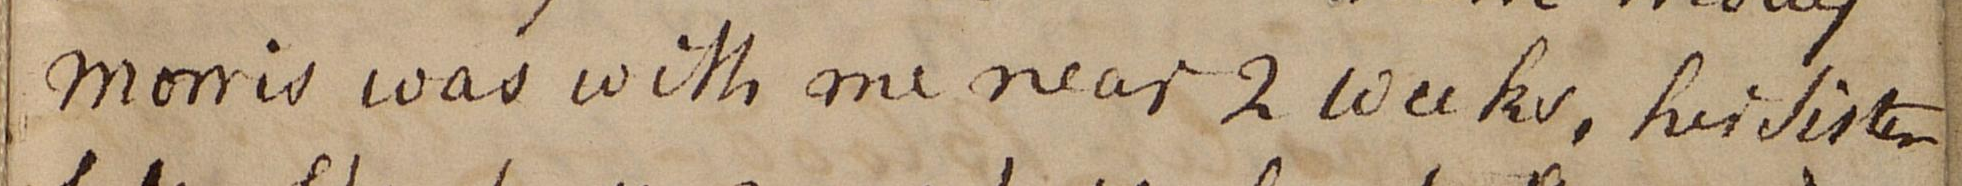morris was with me near 2 weeks, her Sister
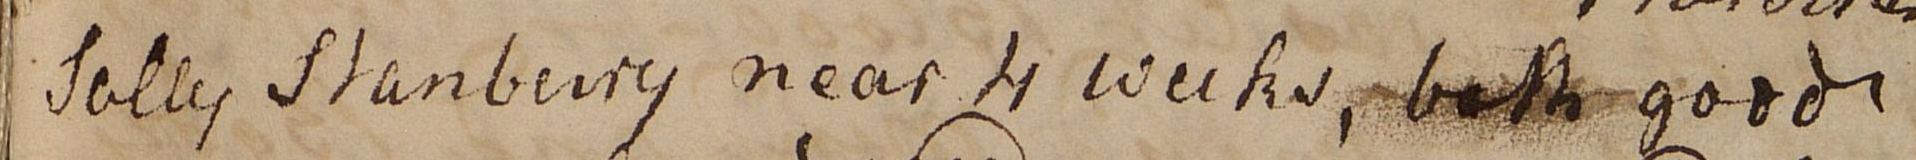Solly Stanberry near 4 Weeks, both good
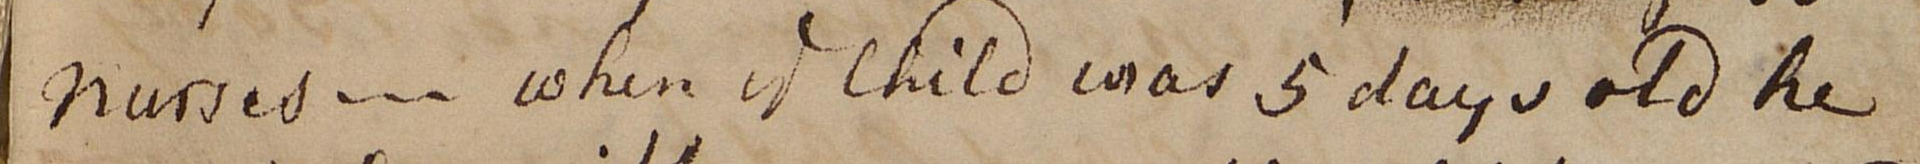nurses-- when y^e Child was 5 days old he
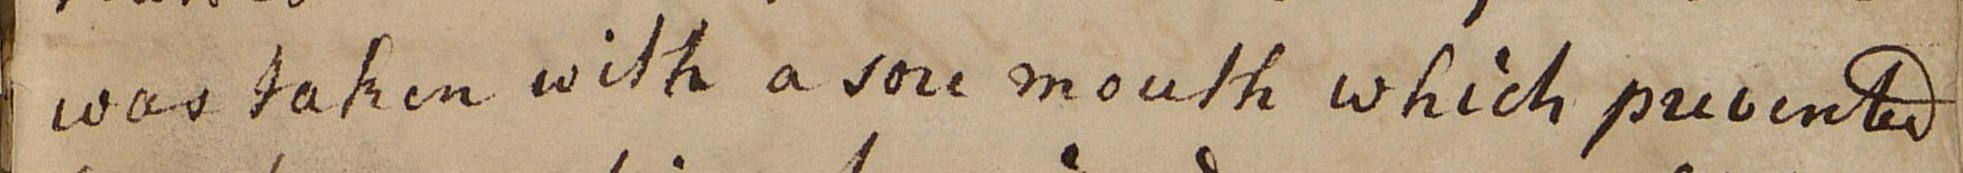was taken with a sore mouth which prevented
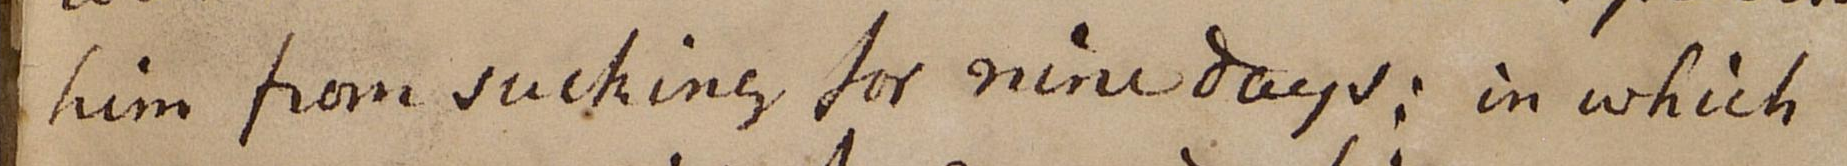him from sucking for nine days; in which
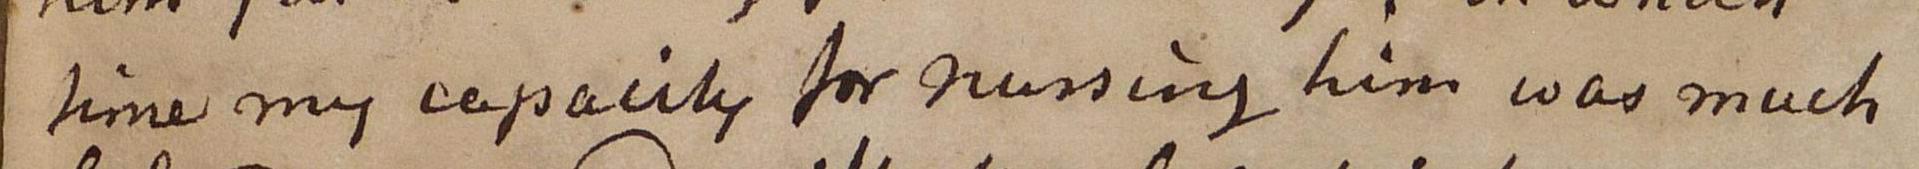time my capacity for nursing him was much
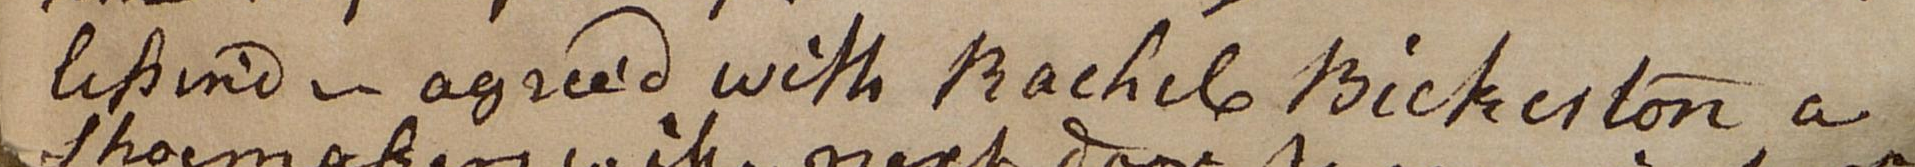lessen'd- agree'd with Rachel Bickerton a
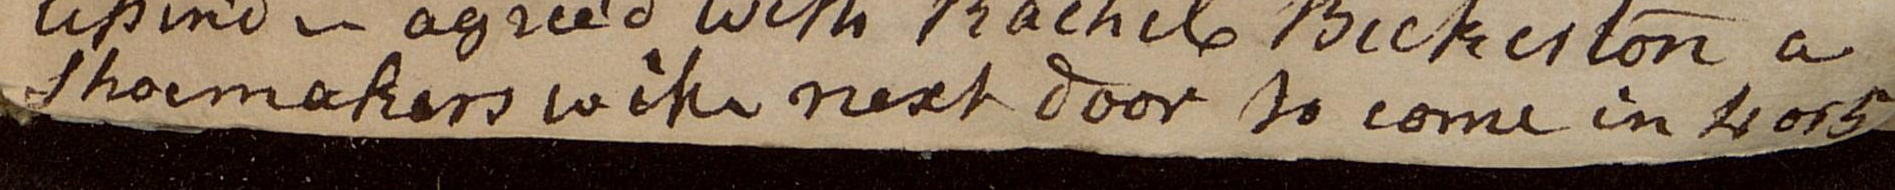Shoemakers wife next door to come in 4 or 5
